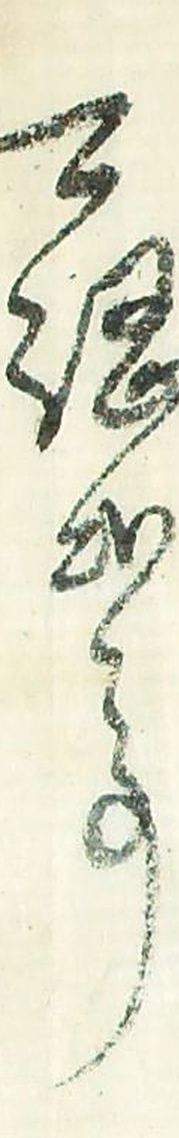可認出候事
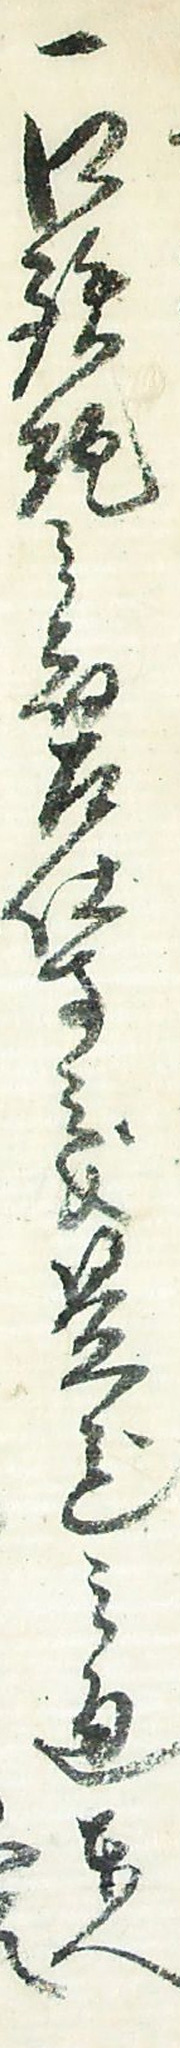一郷鉄砲之者召仕方之義是迄之通本人
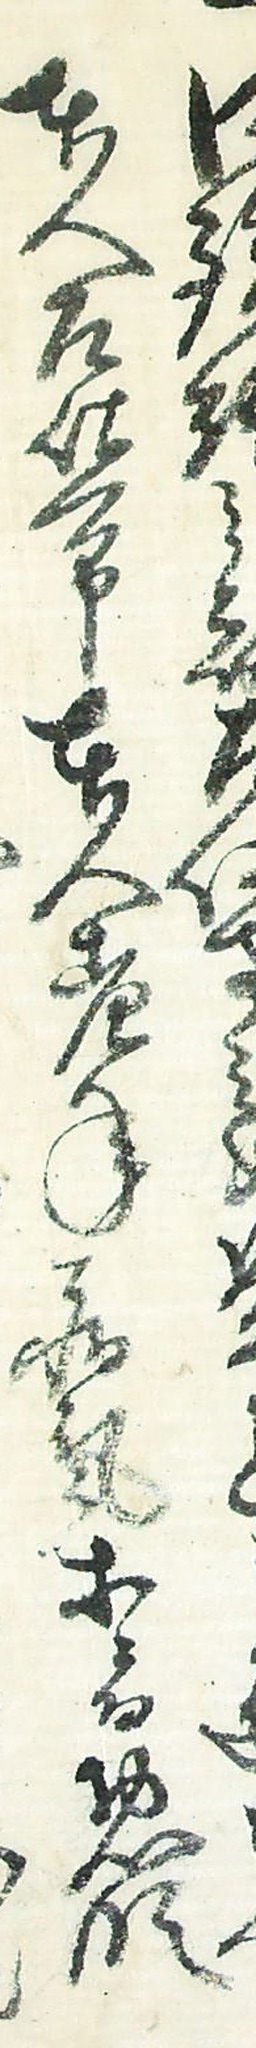本人召仕可申本人老年病気等ニ而惣領
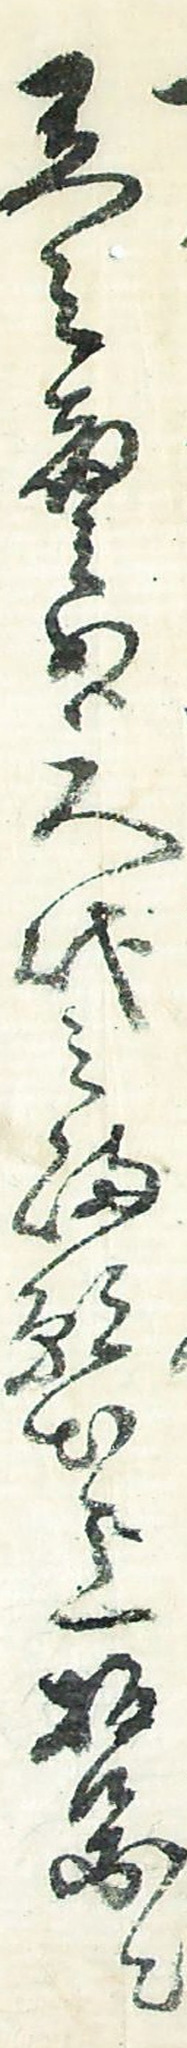有之者之義ハ人代之備願出候上指圖ニ
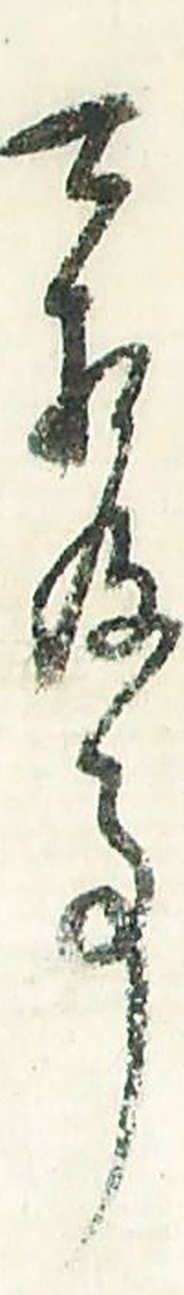可相及事

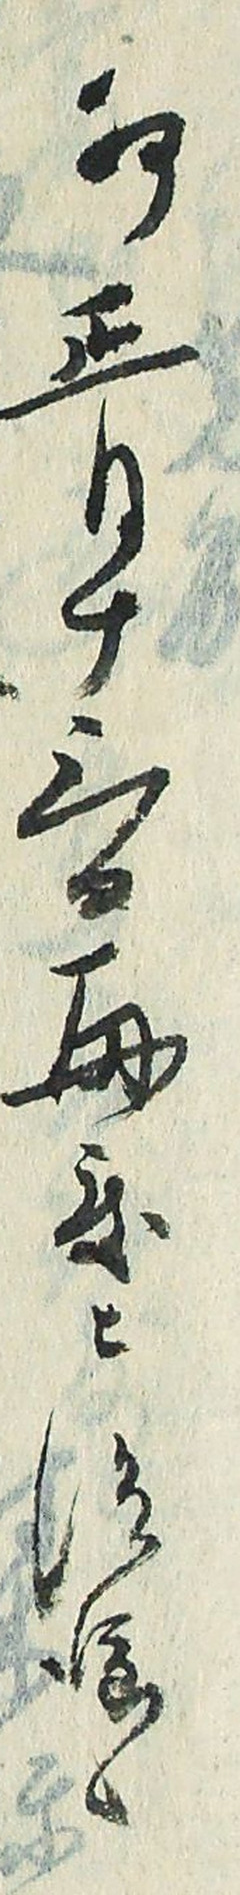○卯正月十三日再度被仰渡候
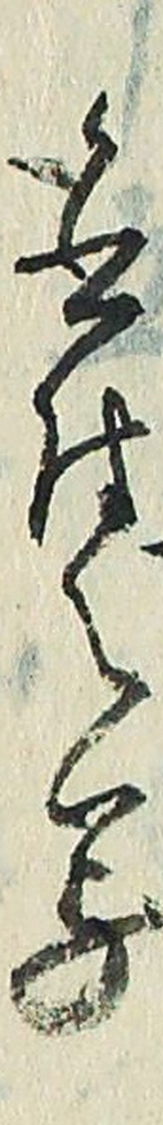書付之写
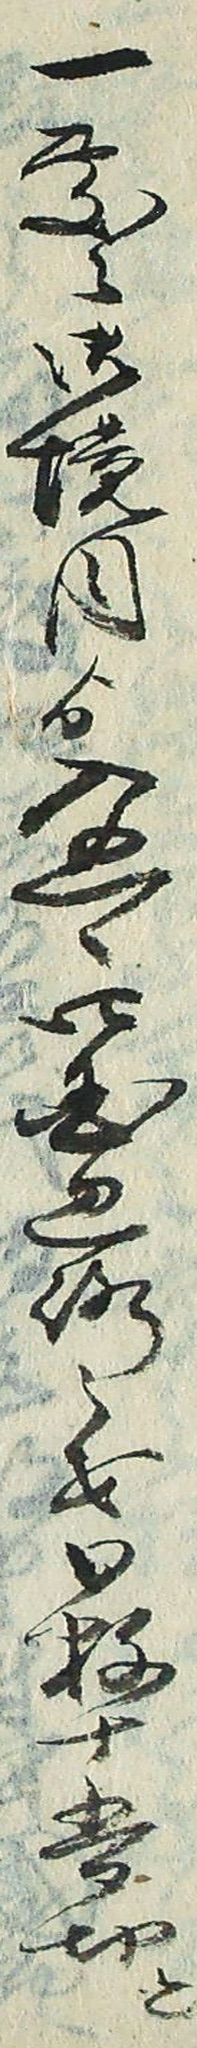一處々御境目ゟ入込候四国辺路之義日数十五日切と
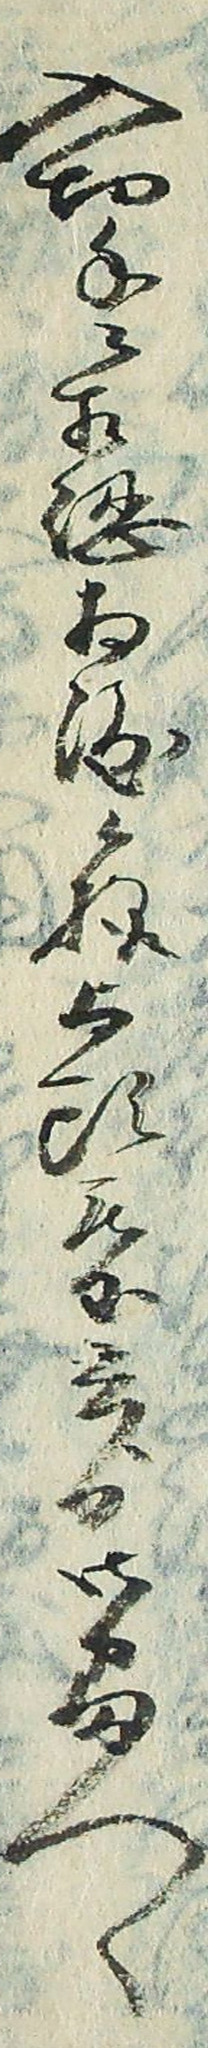入切手ニ相認相渡候様与頭庄屋共ゟ御番人へ
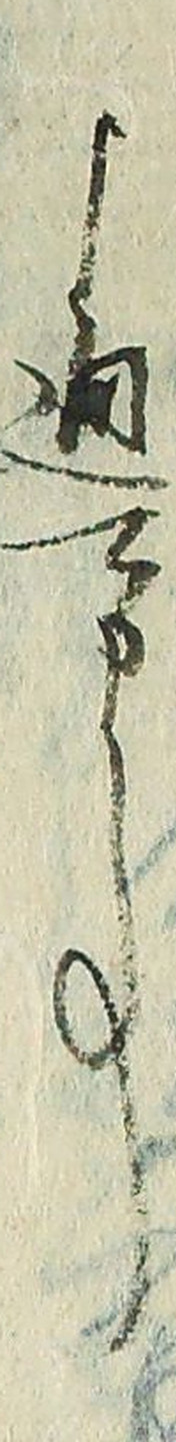申通可申事
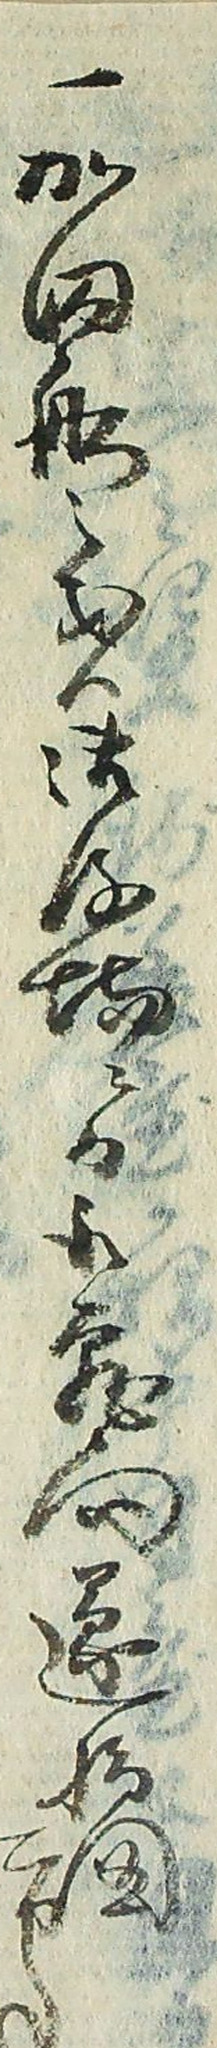一加田舩之義ハ御役場ニ而取究向遂指図可申事
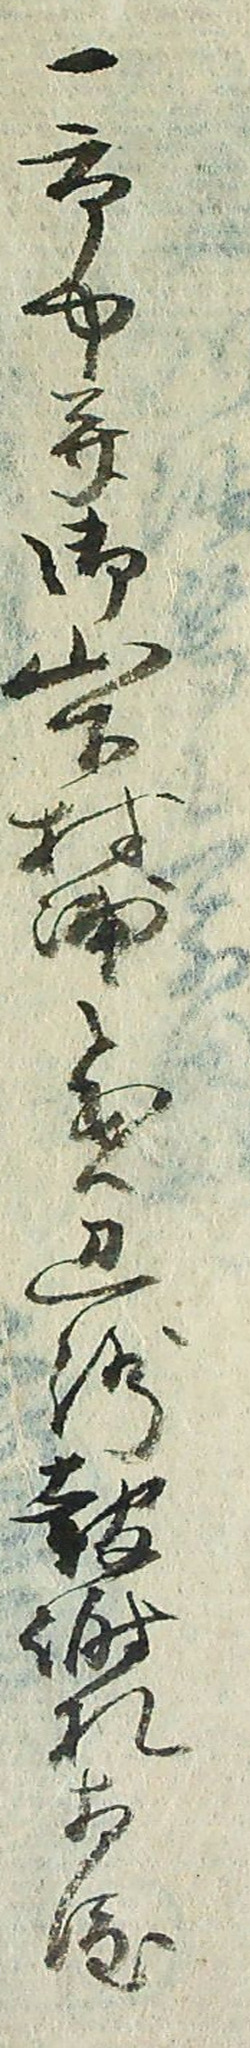一市中幷御山下村浦之義ハ辺路報謝札相渡
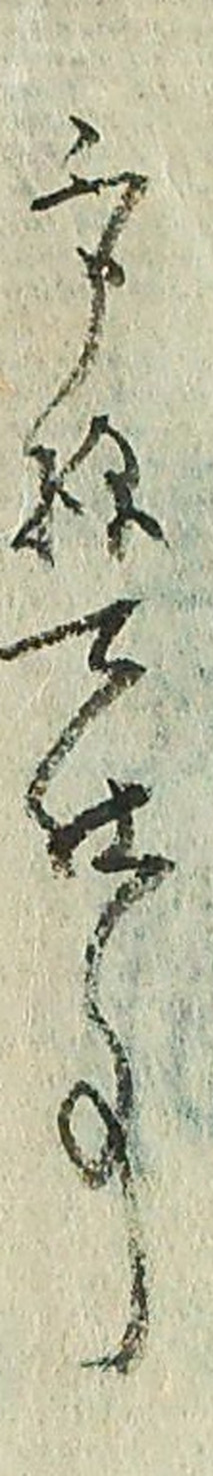不申様可仕事
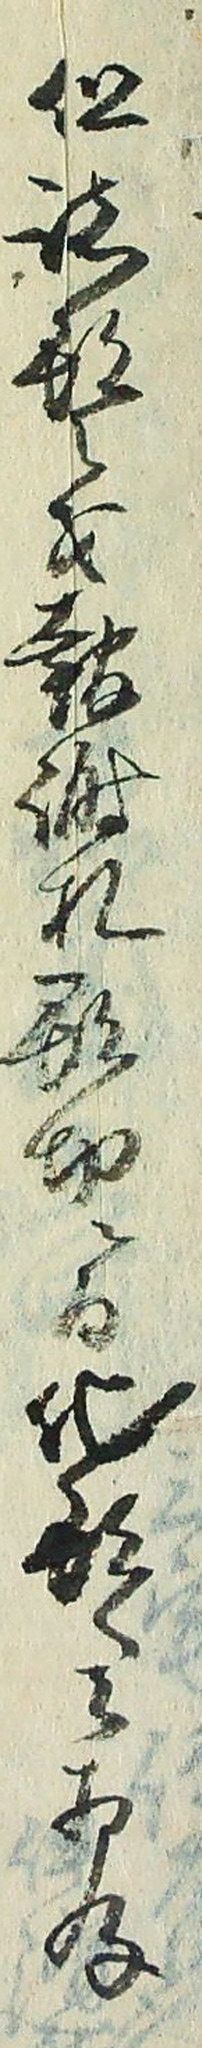但諸郡之義報謝札郡切ニ而他郡へ者相及
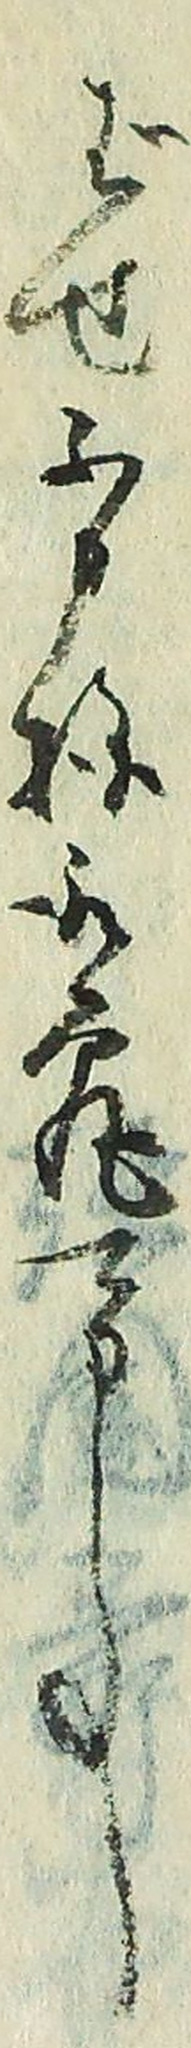ばせ不申様取究可申事
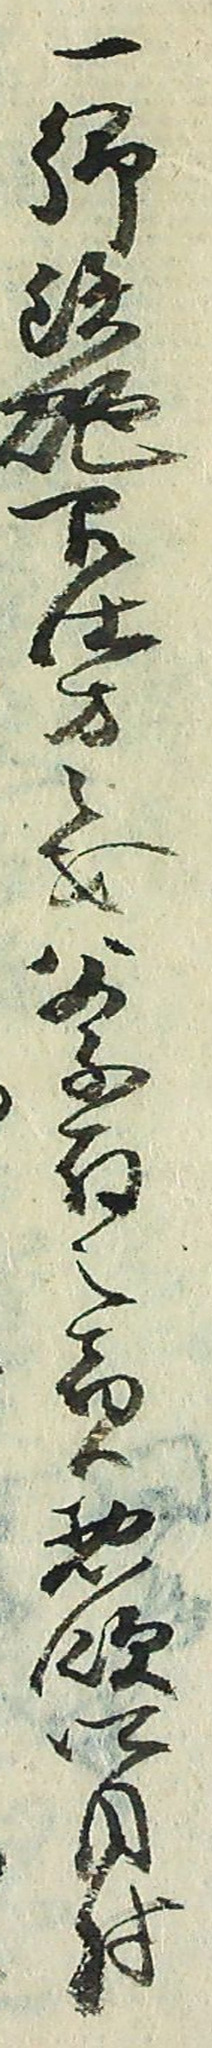一郷鉄砲召仕方之義ハ父子有之者ハ惣領郷目付
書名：諸御趣意書并御下知向之写
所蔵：鳴門教育大学 Naruto University of Education
